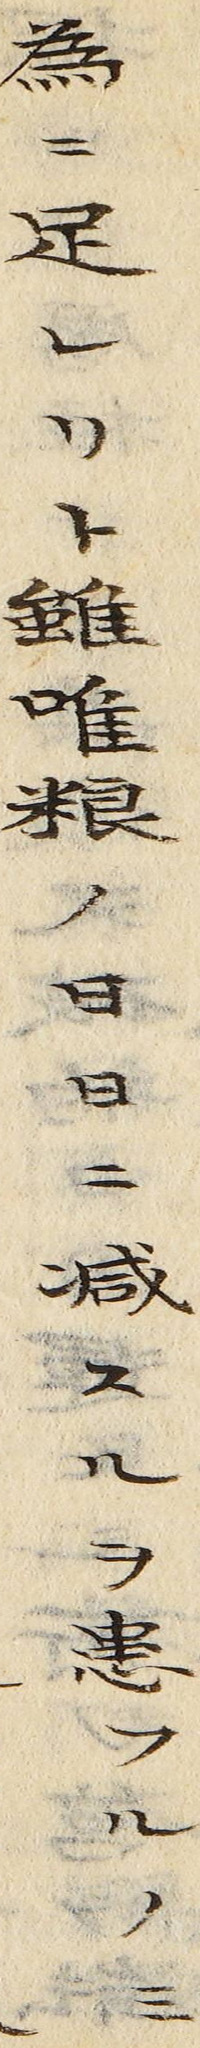為ニ足レリト雖唯糧ノ日日ニ減スルヲ患フルノミ
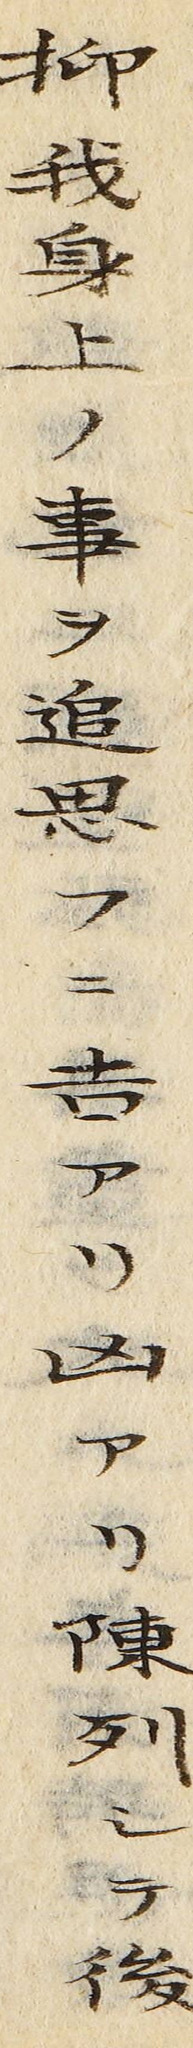抑我身上ノ事ヲ追思フニ吉アリ凶アリ陳列シテ後
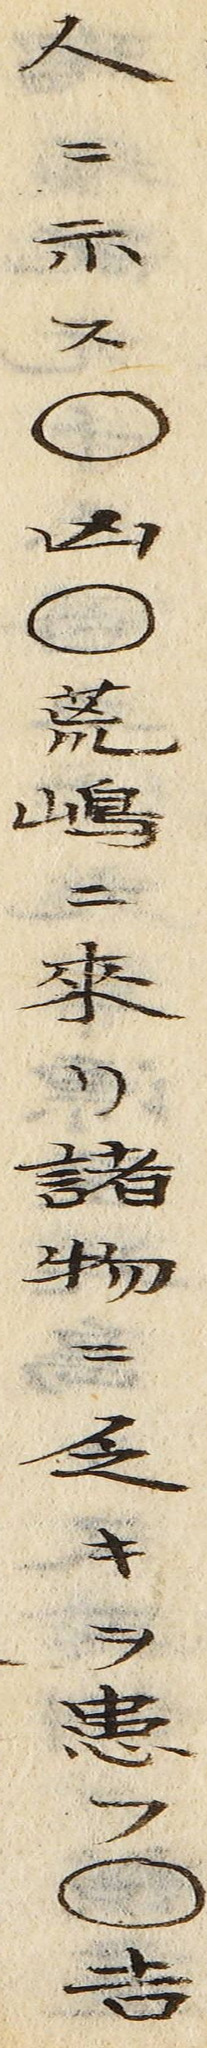人ニ示ス◯凶◯荒島ニ来リ諸物ニ乏キヲ患フ◯吉
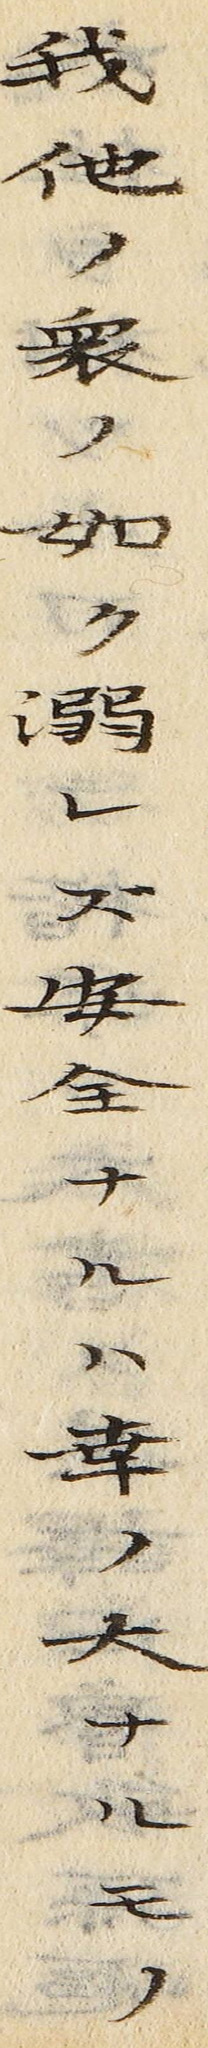我他ノ衆ノ如ク溺レズ安全ナルハ幸ノ大ナルモノ
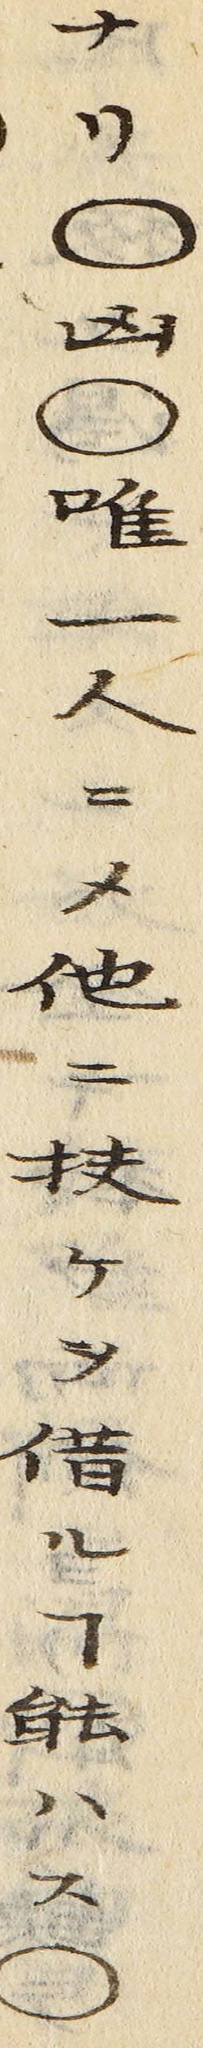ナリ◯凶◯唯一人ニシテ他ニ扶ケヲ借ルコト能ハス◯
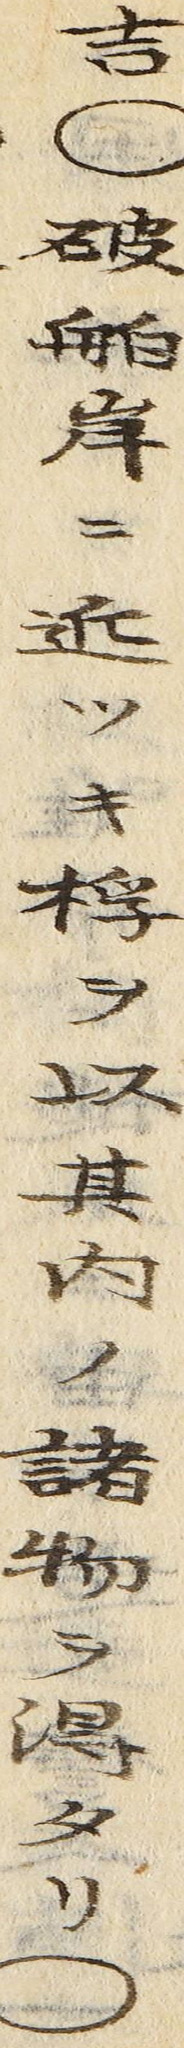吉◯破舶岸ニ近ツキ桴ヲ以其内ノ諸物ヲ得タリ◯
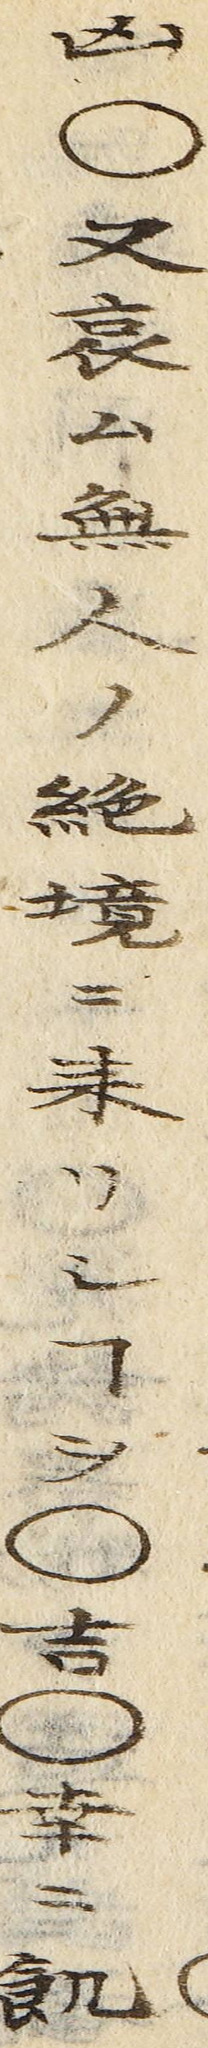凶◯又哀ム無人ノ絶境ニ来リシコトヲ◯吉◯幸ニ飢
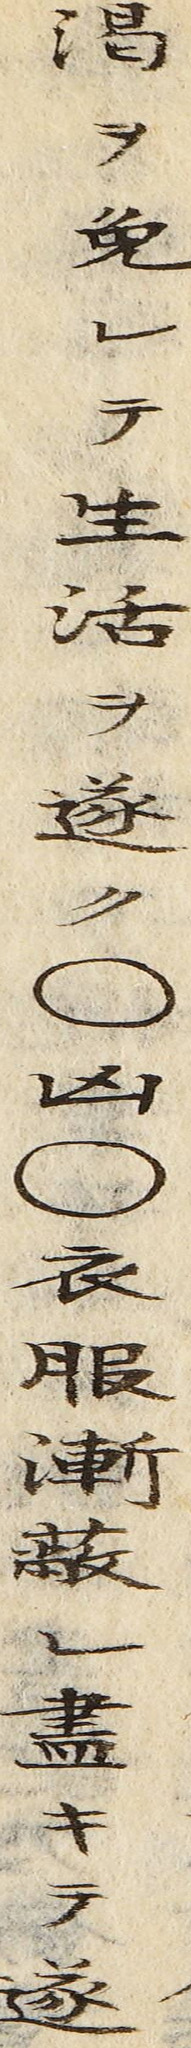渇ヲ免レテ生活ヲ遂ク◯凶◯衣服漸蔽レ尽キテ遂
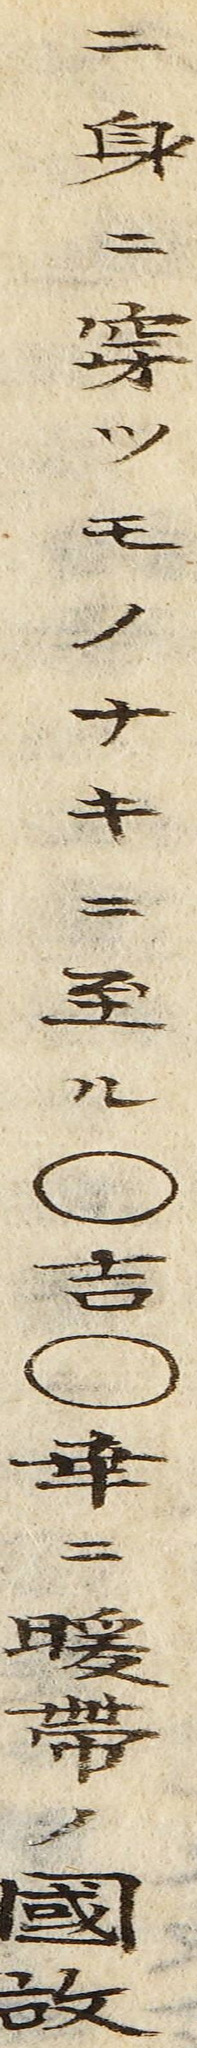ニ身ニ穿ツモノナキニ至ル◯吉◯幸ニ暖帯ノ国故
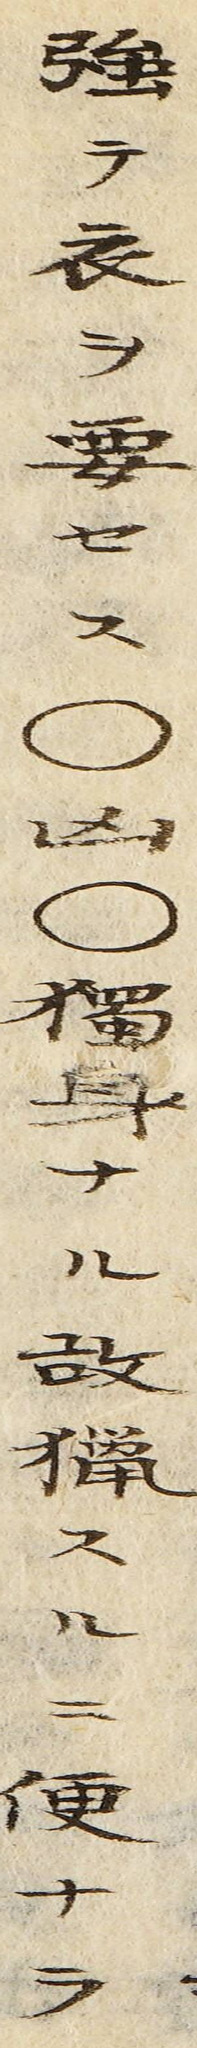強テ衣ヲ要セス◯凶◯独身ナル故猟スルニ便ナラ
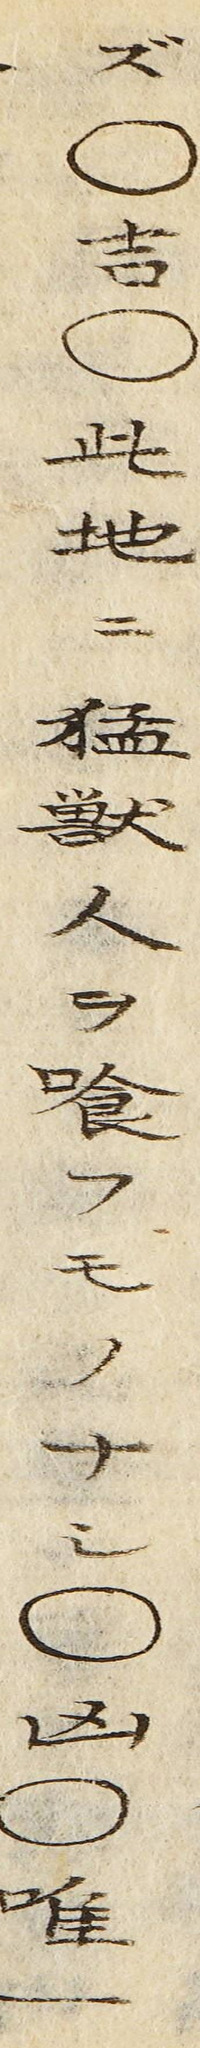ズ◯吉◯此地ニ猛獣人ヲ喰フモノナシ◯凶◯唯一
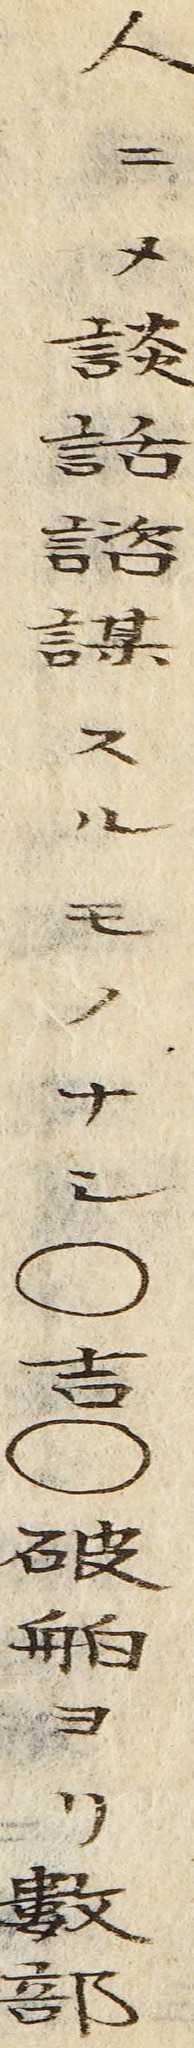人ニシテ談話諮謀スルモノナシ◯吉◯破舶ヨリ数部
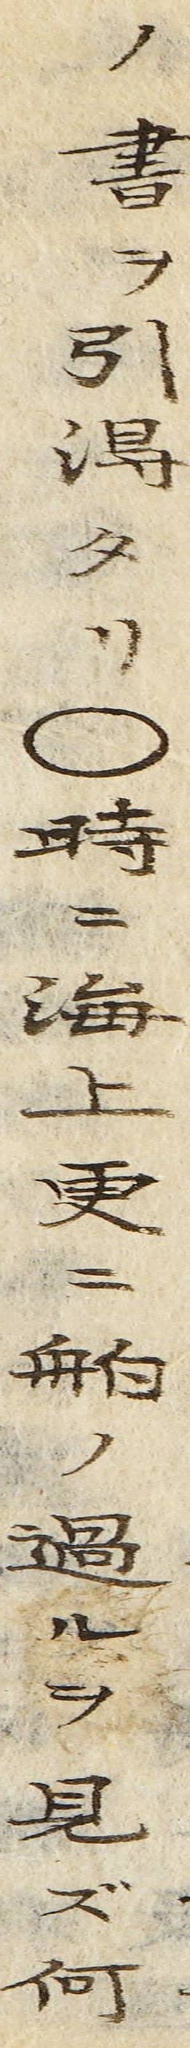ノ書ヲ引得タリ◯時ニ海上更ニ舶ノ過ルヲ見ズ何
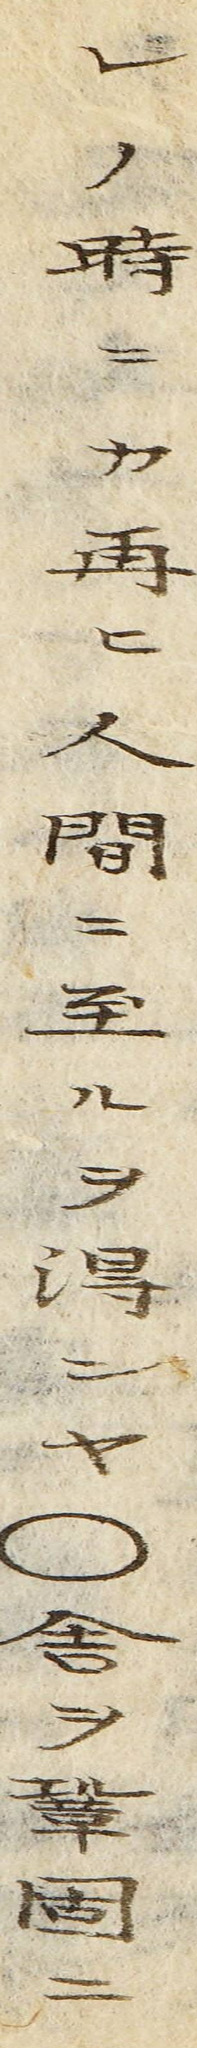レノ時ニカ再ヒ人間ニ至ルヲ得ンヤ◯舎ヲ鞏固ニ
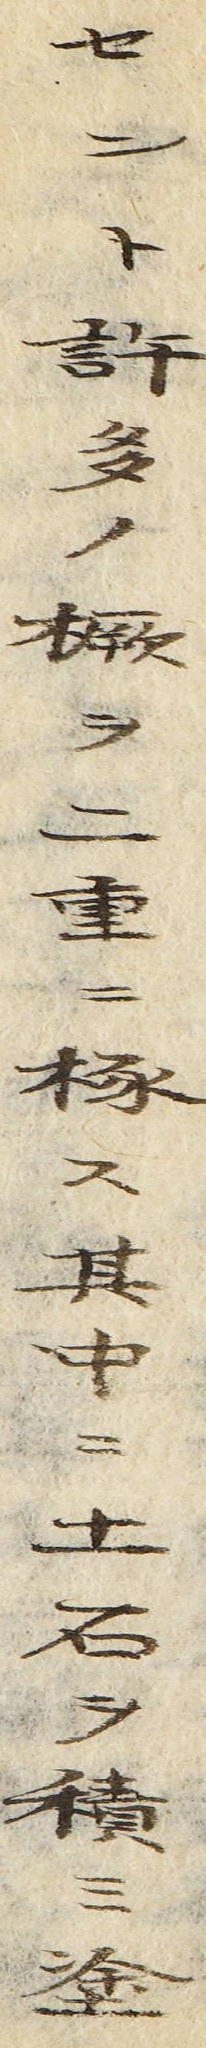セント許多ノ橛ヲ二重ニ椽ス其中ニ土石ヲ積ミ塗

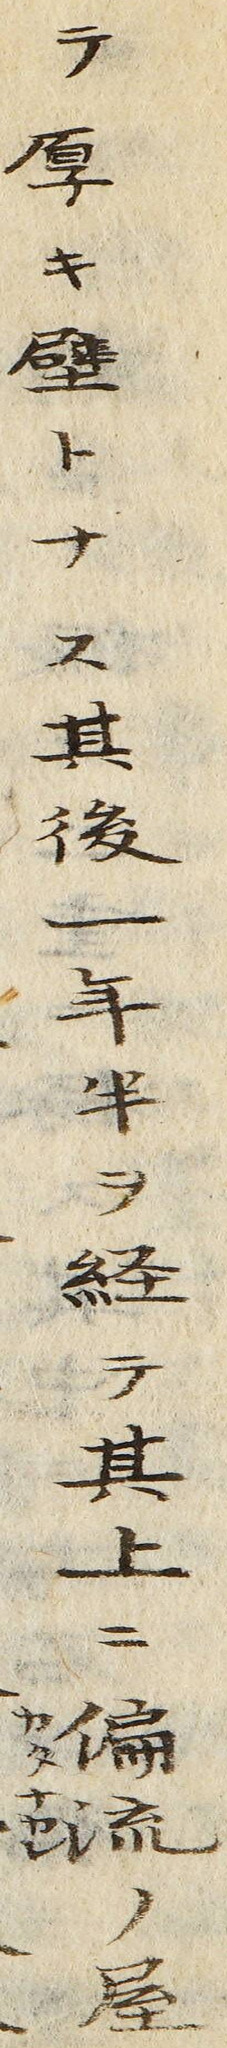テ厚キ壁トナス其後一年半ヲ経テ其上ニ偏流ノ屋
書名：漂流紀事
